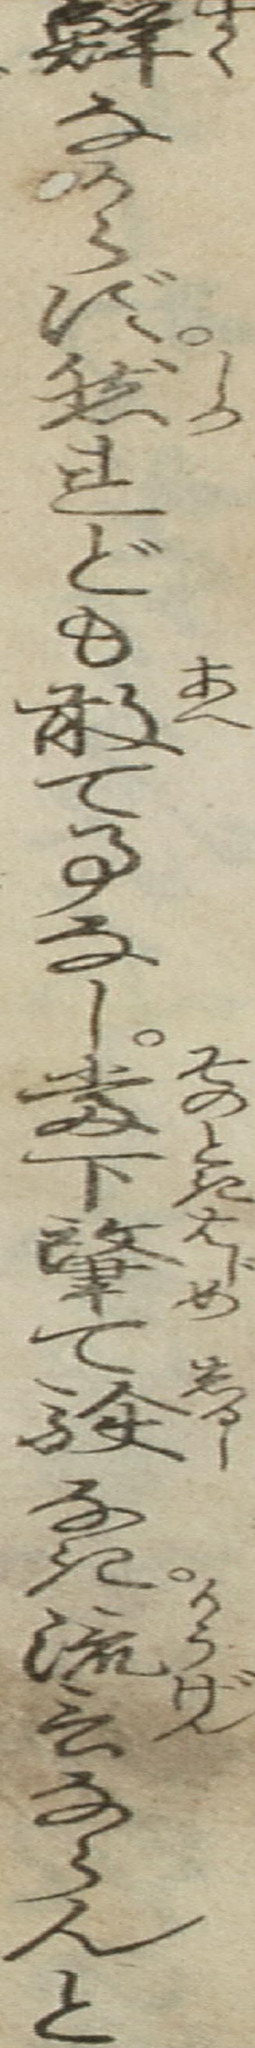鮮なからず。然れども敢て事なし。当下肇て験なき。流言ならんと
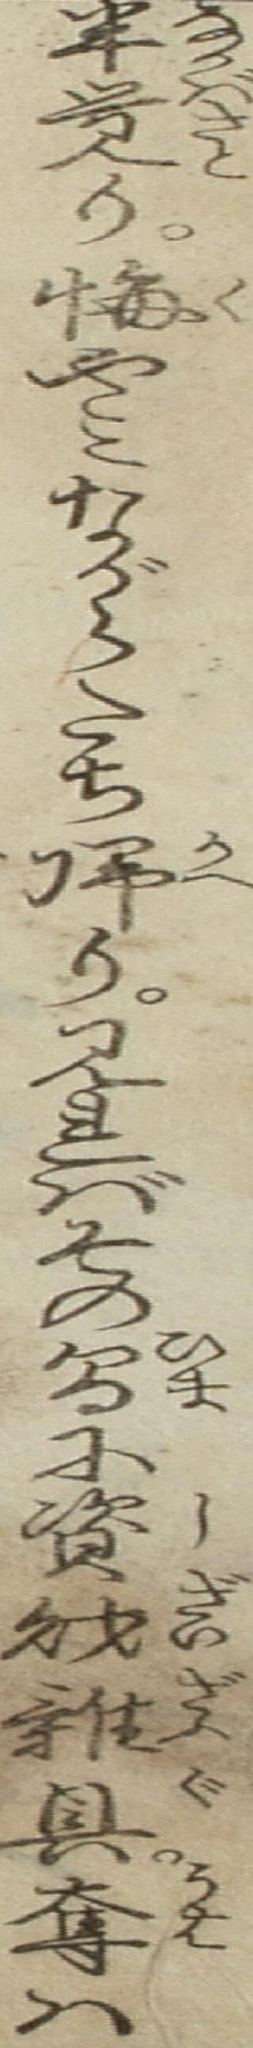半覚り。悔やみながらたち帰り。見ればその間に資財雑具。奪は
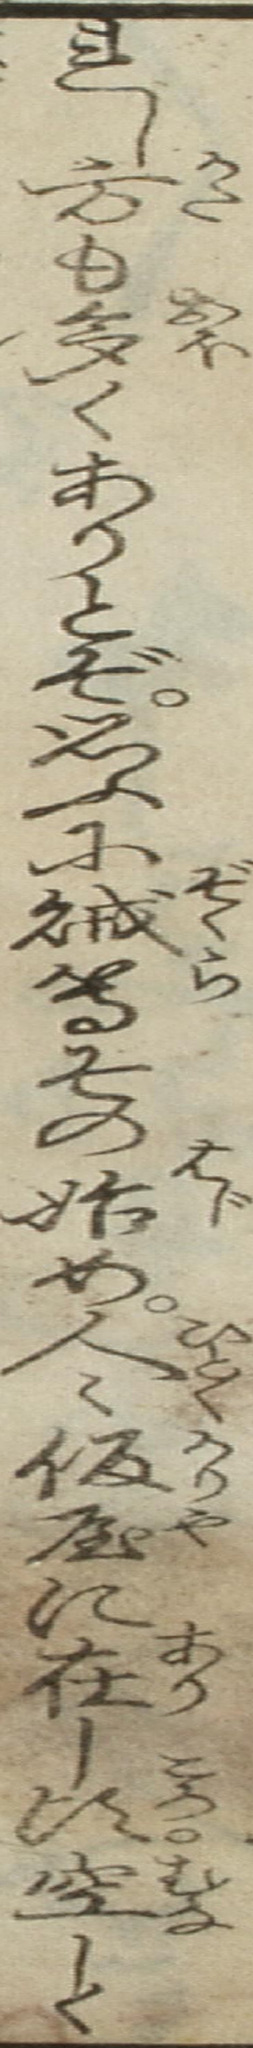れし方も多くありとぞ。思ふに賊等その始め。人〻仮屋に在し頃。空しく
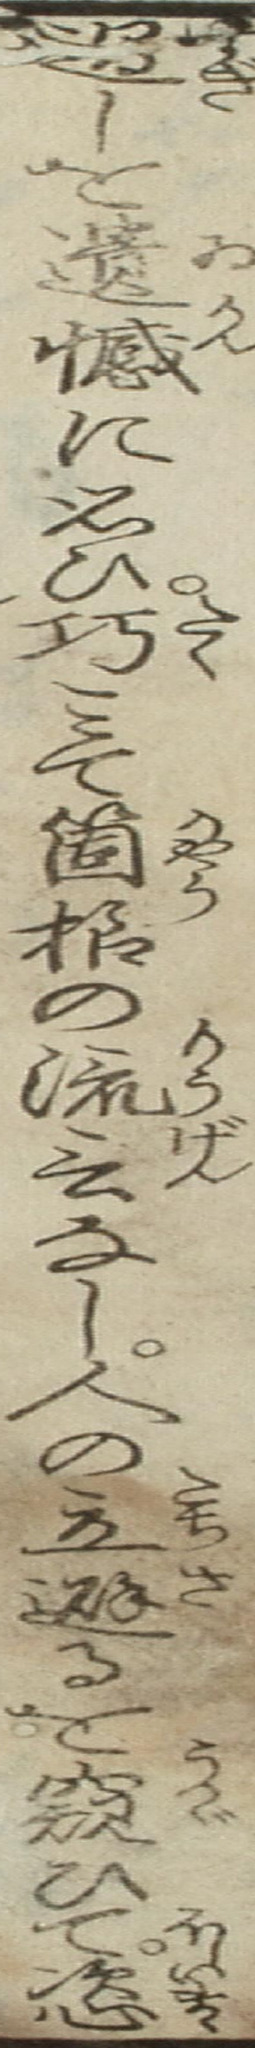過しを遺憾に思ひ。巧みて箇様の流言なし。人の立避るを窺ひて。恣
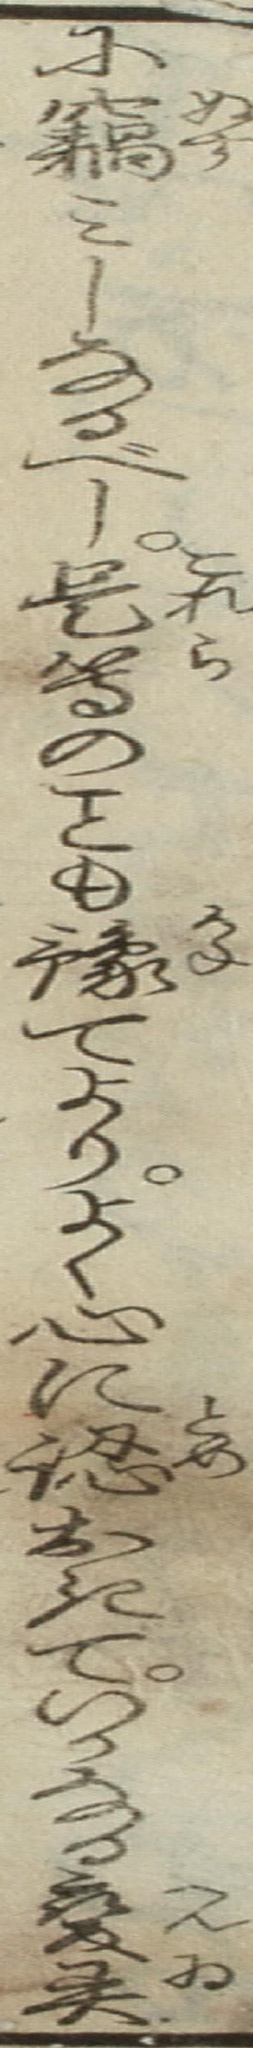に竊みしなるべし。是等のことも豫てより。よく心に認おきて。いかなる変異
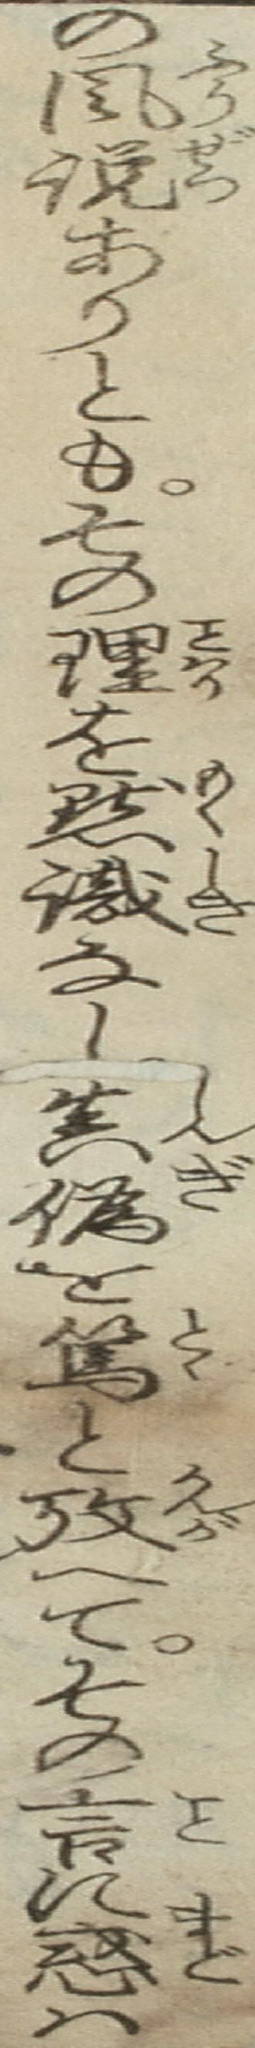の風説ありとも。その理を黙識なし。真偽を篤と攷へて。その言に惑は
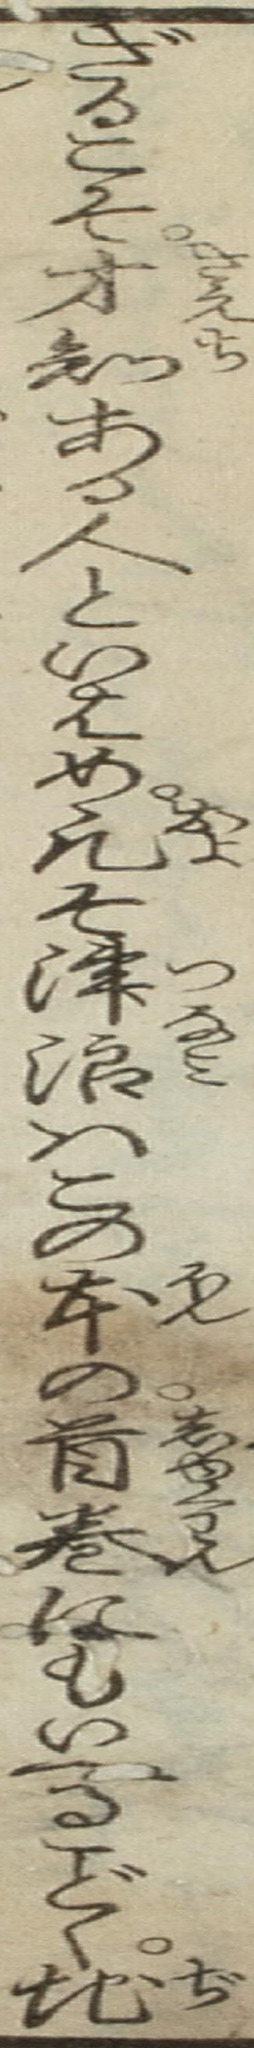ざるこそ。才知ある人といはめ。凡そ津浪はこの本の首巻にもいへるごとく。地
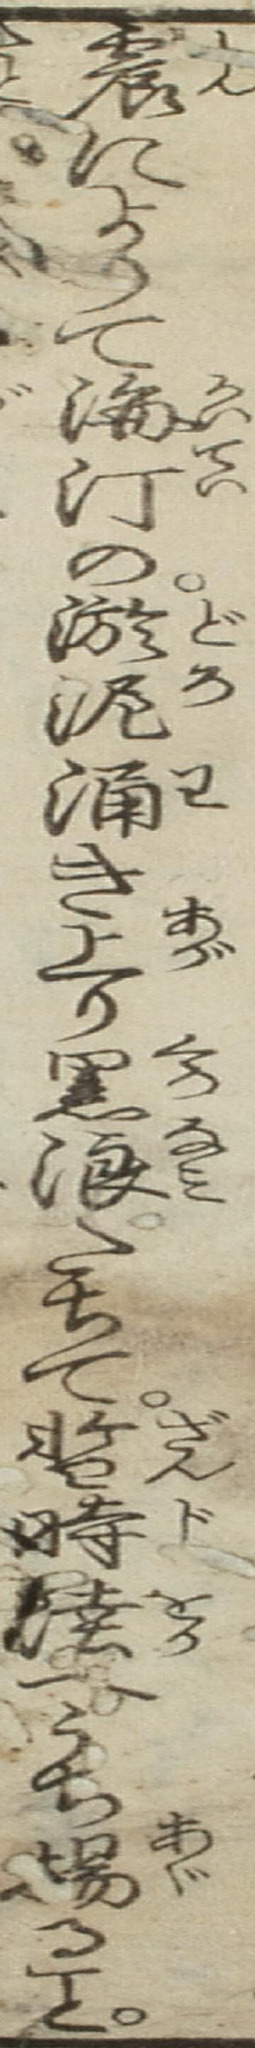震によりて海汀の。淤泥湧き上り黒浪たちて。暫時陸へうち揚ること。
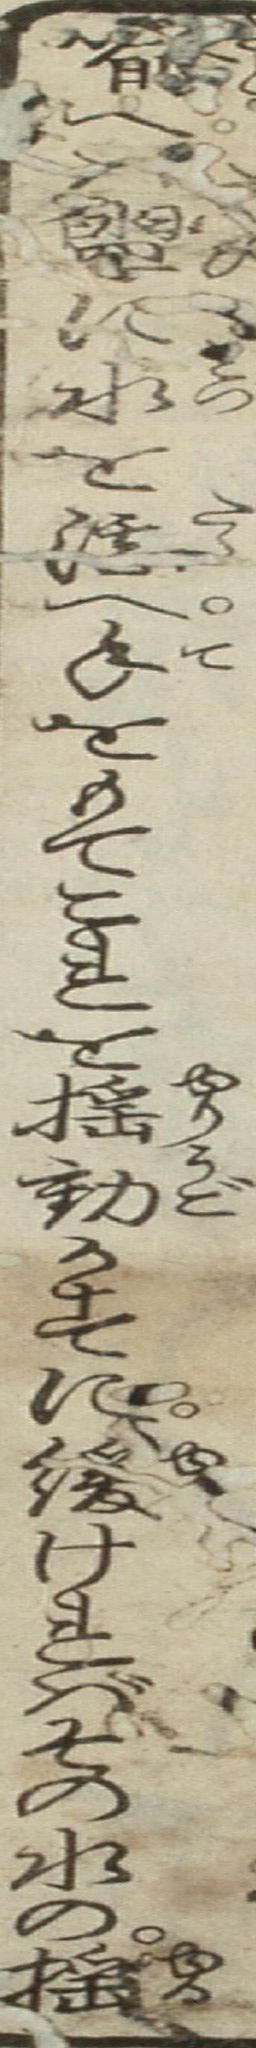喩へば盥に水を湛へ。手をもてこれを揺動かすに。緩ければその水の。揺
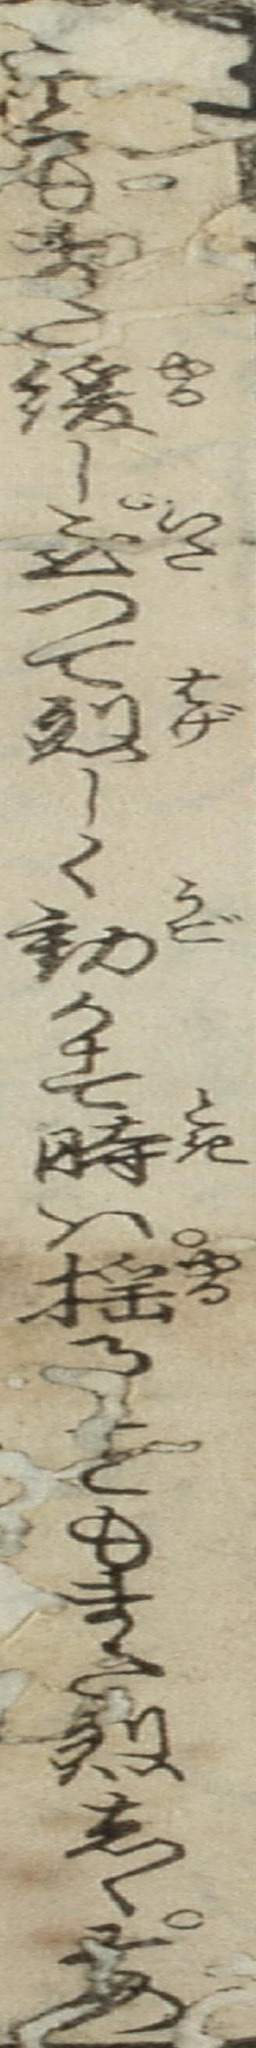ることもまた緩し。至つて烈しく動かす時は。揺ることもまた烈しく。その
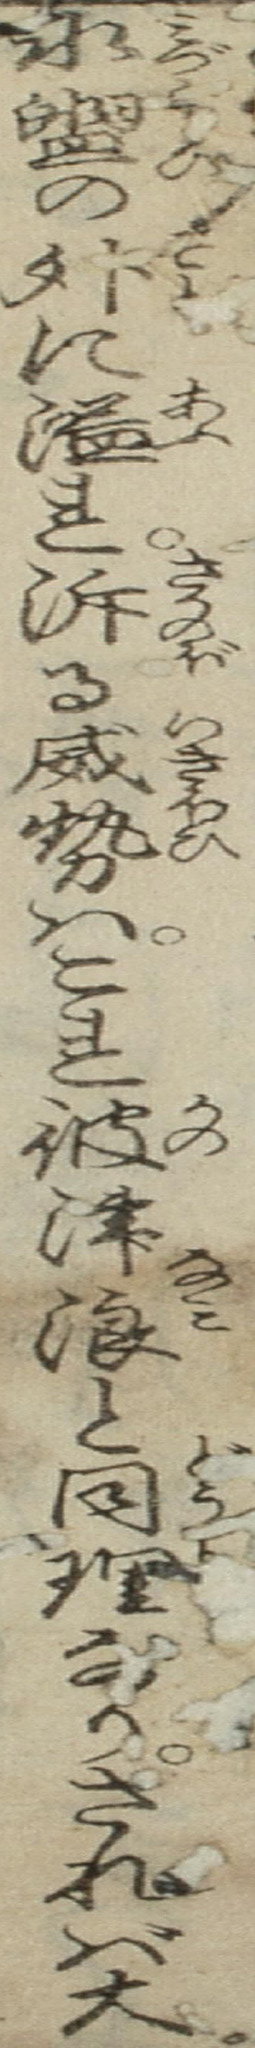水盥の外に溢れ。泝る威勢は。これ彼津浪と同理なり。されば大
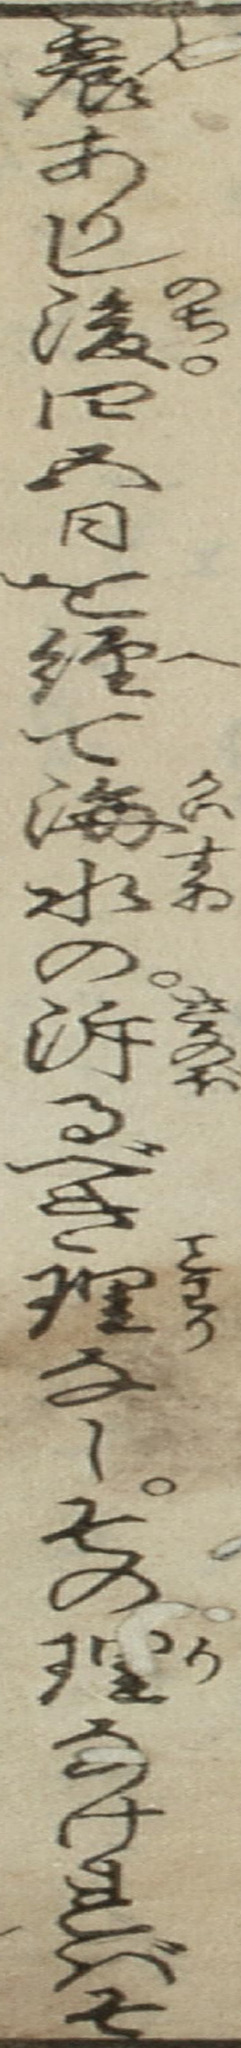震ありし後。四五日を経て海水の泝るべき理なし。その理なければそ
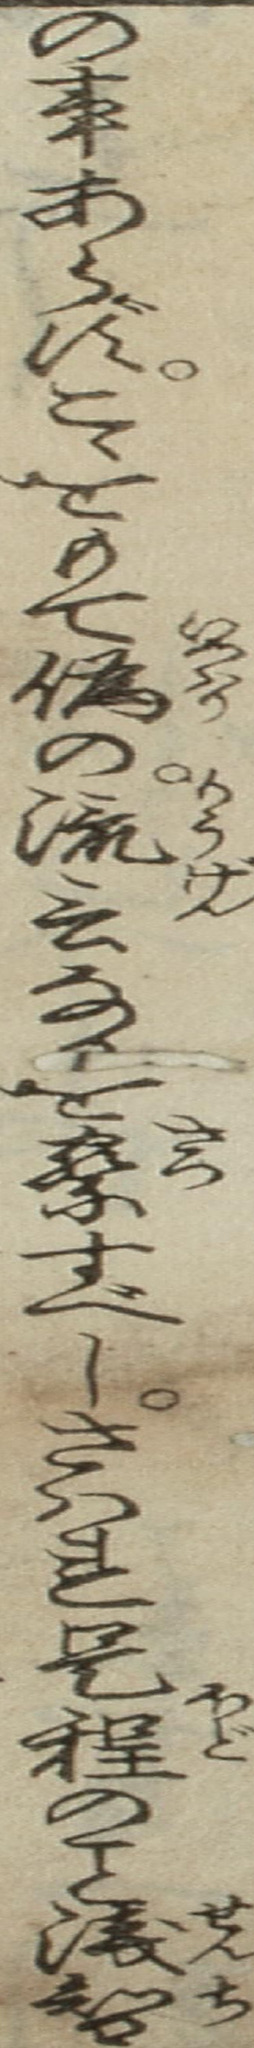の事あらず。こゝをもて偽の。流言なるを察すべし。さはれ是程のこと浅智
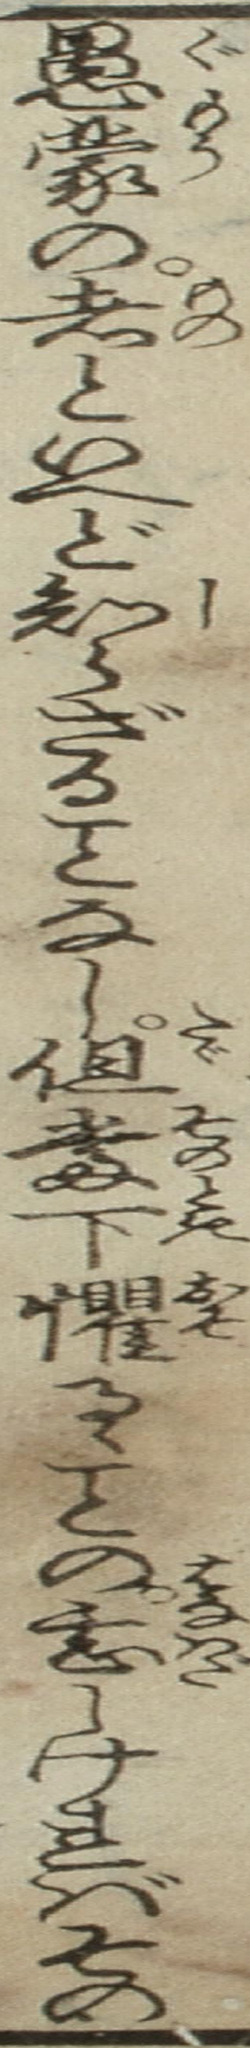愚蒙の。者といへど知らざることなし。但当下懼るゝことの甚しければその
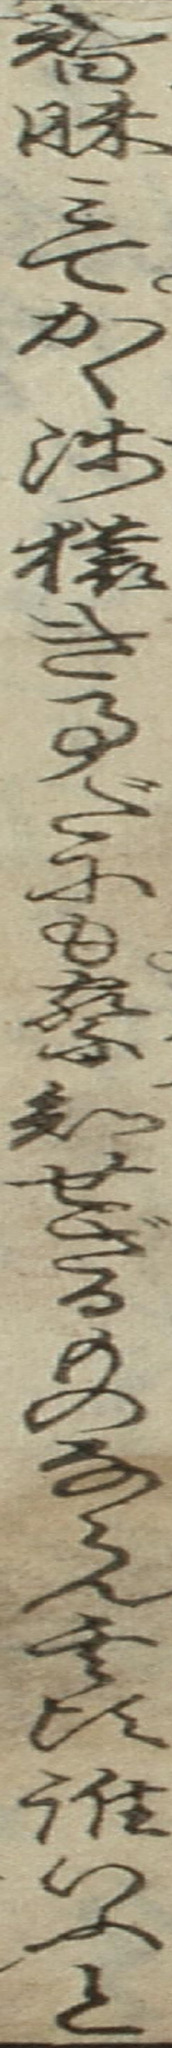智昧みて。かく浅猿き事だにも。察知せざるものならん。其頃誰いふと
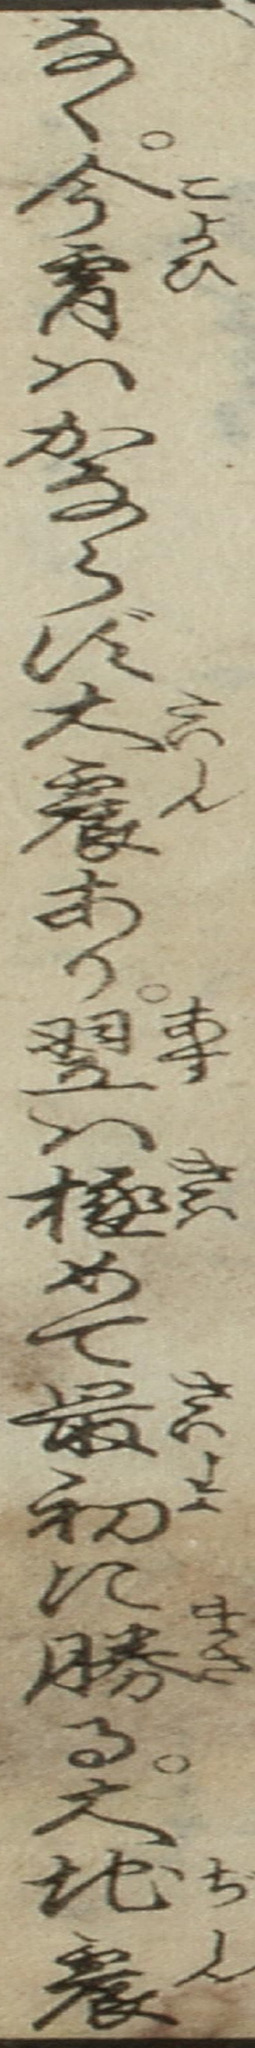なく。今宵はかならず大震あり。翌は極めて最初に勝る。大地震
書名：安政見聞録　中
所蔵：東京大学地震研究所図書室 Earthquake Research Institute Library, The University of Tokyo, JAPAN
